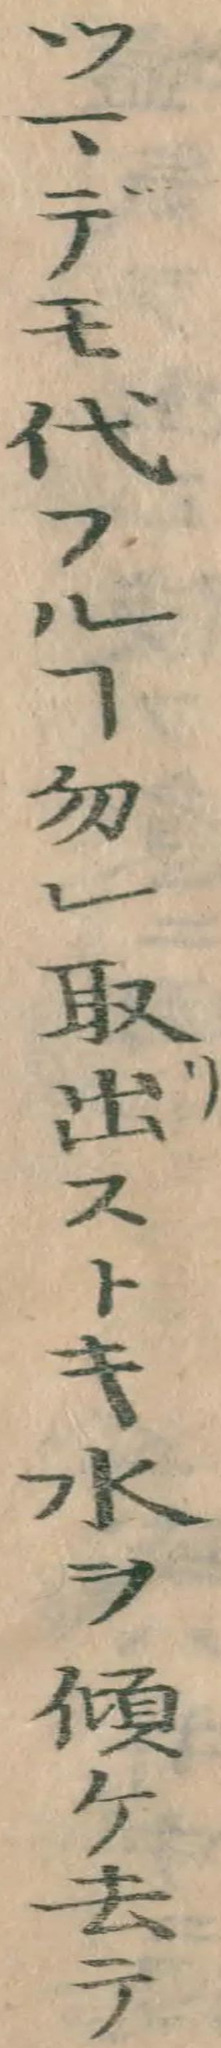ツマデモ代フツコト勿レ取出ストキ水ヲ傾ケ去テ
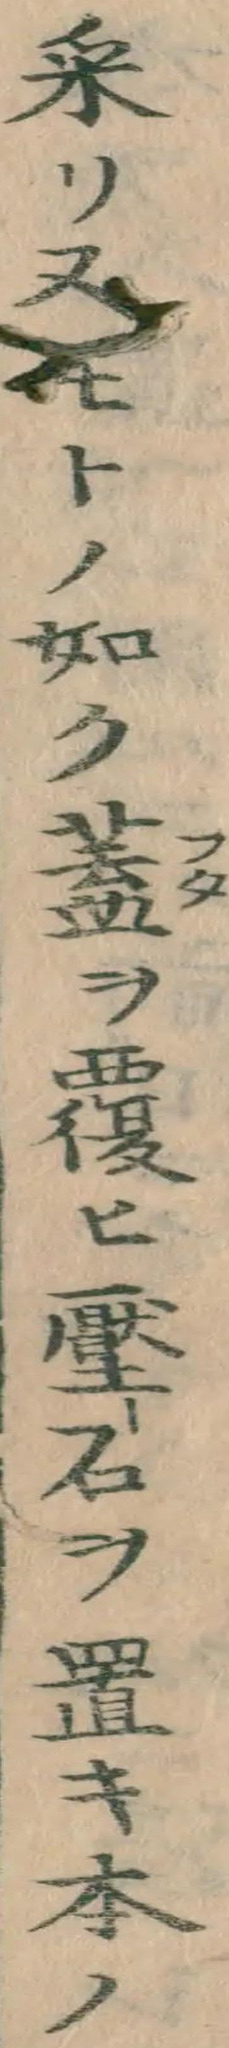采リ又モトノ如ク葢ヲ覆ヒ壓石ヲ置キ本ノ

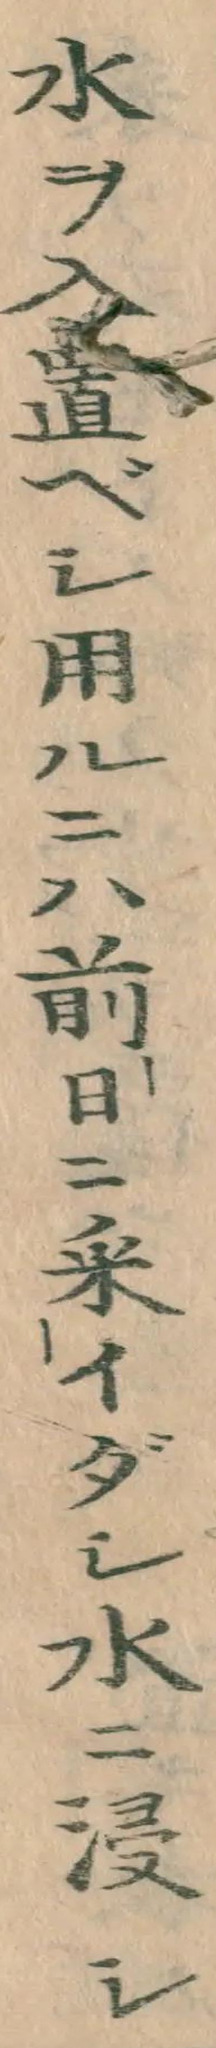水ヲ入置ベシ用ルニハ前日ニ采イダシ水ニ浸シ
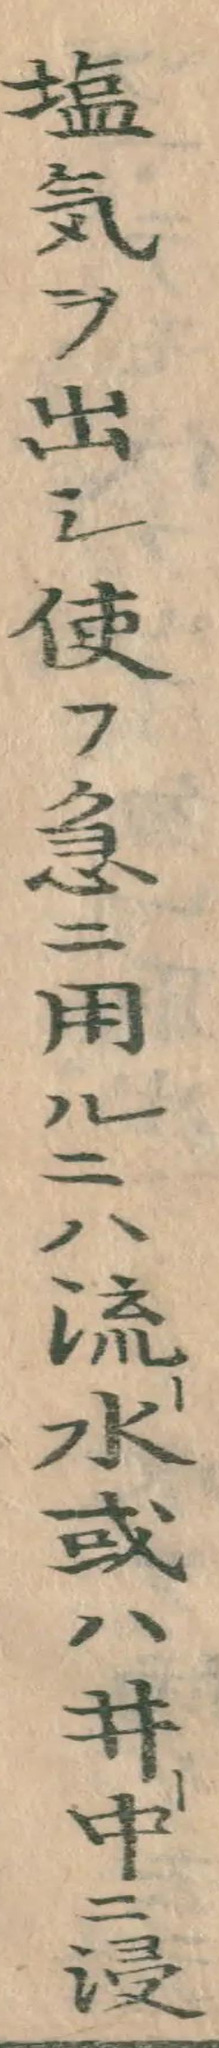塩気ヲ出シ使フ急ニ用ルニハ流水或ハ井中ニ浸
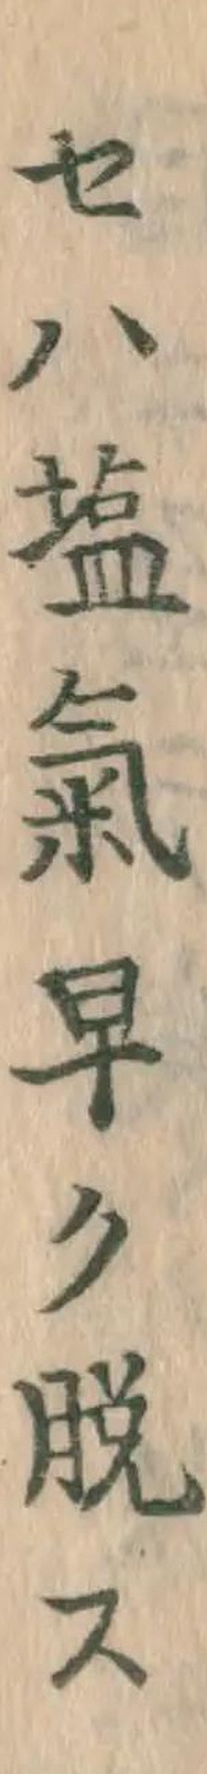セハ塩気早ク脱ス
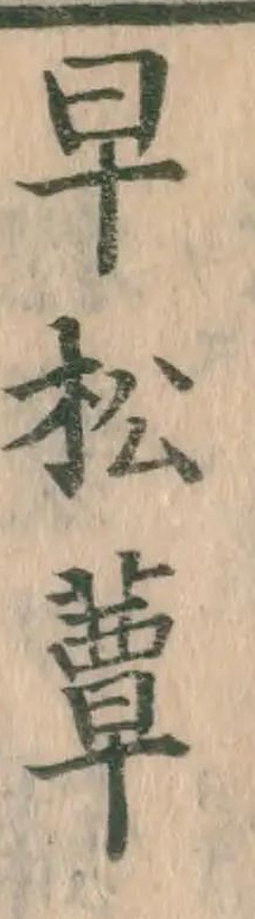早松蕈
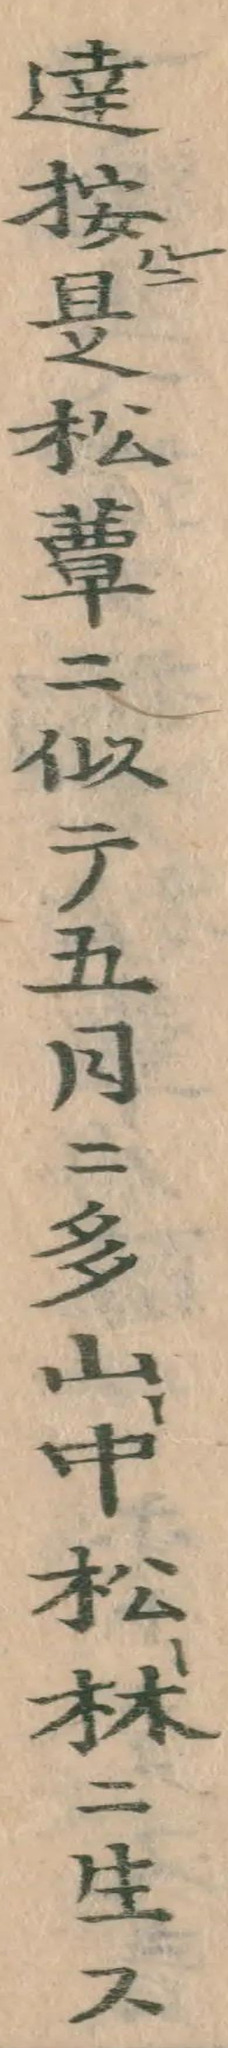達按是松蕈ニ似テ五月ニ多山中松林ニ生ス
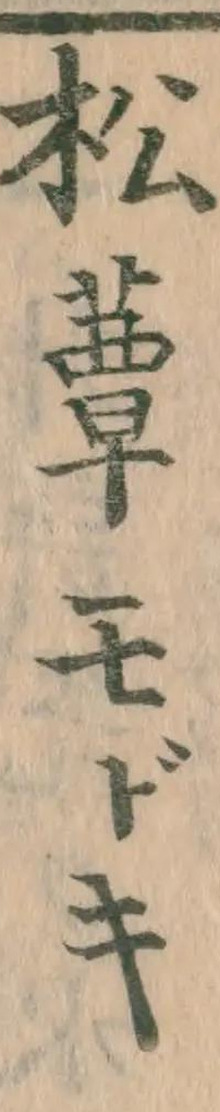松蕈モドキ
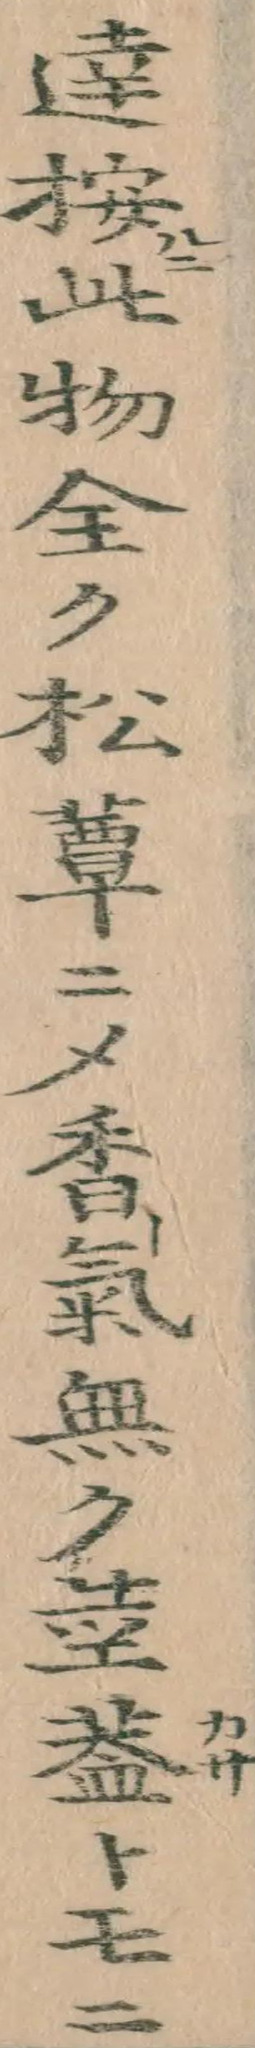達按此物全ク松蕈ニシテ香気無ク茎葢トモニ
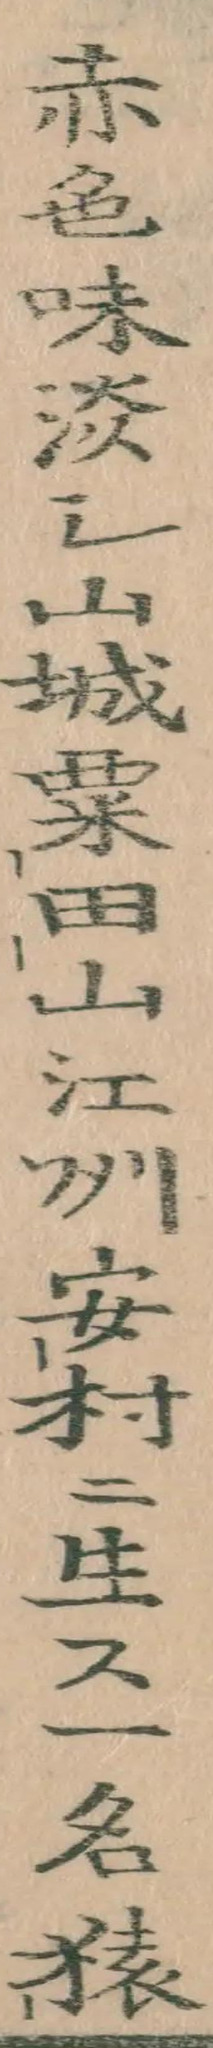赤色味淡シ山城粟田山江州安村ニ生ス一名猿
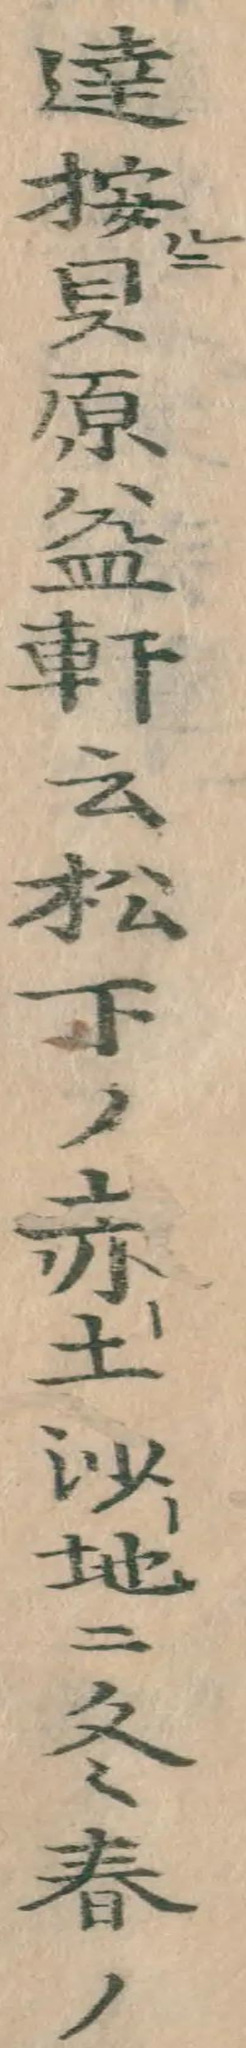達按貝原益軒云松下ノ赤土沙地ニ冬春ノ
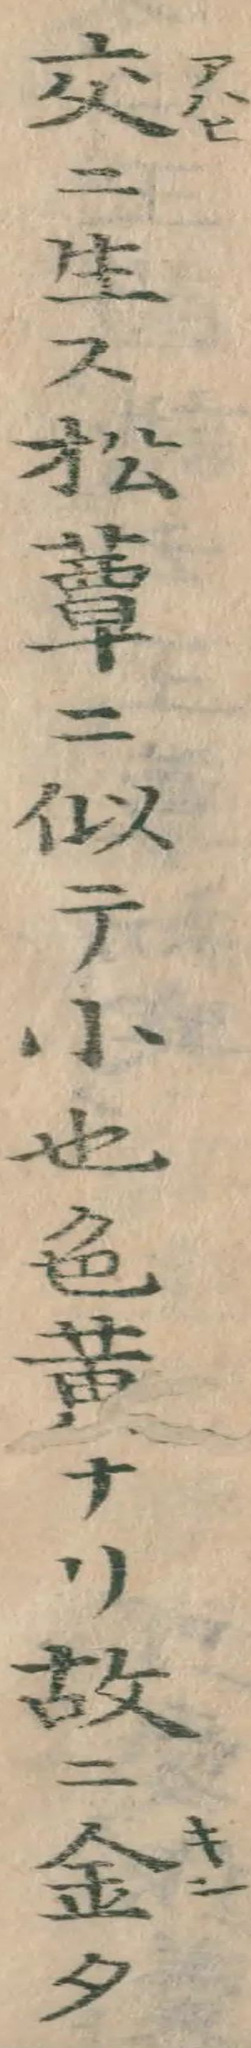交ニ生ス松蕈ニ似テ小也色黄ナリ故ニ金タ
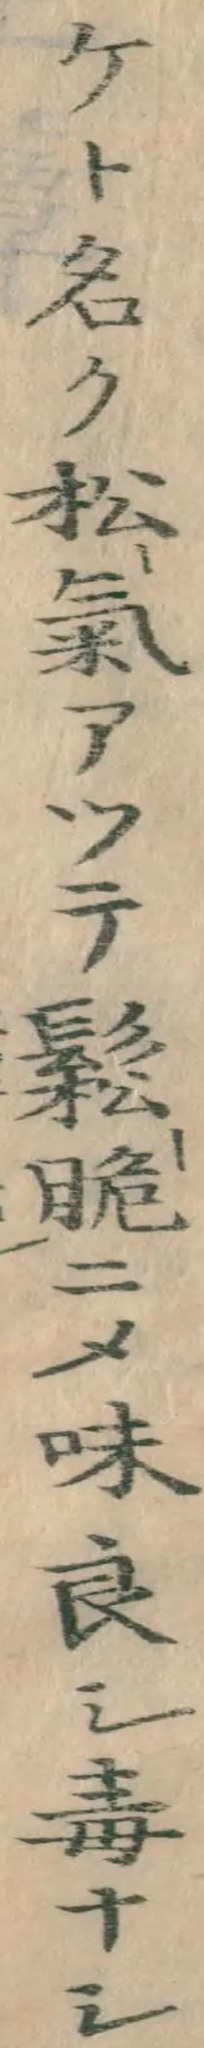ケト名ク松気アツテ鬆脆ニシテ味良シ毒ナシ

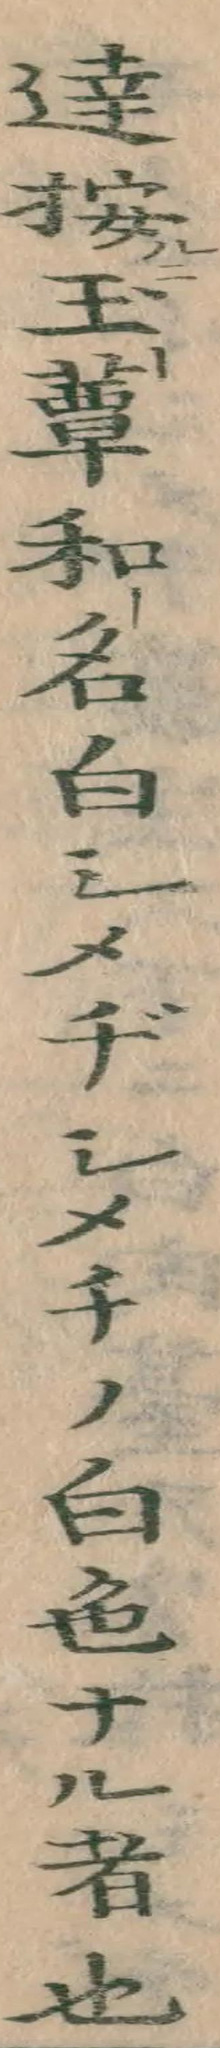達按玉蕈和名白シメヂシメチノ白色ナル者也
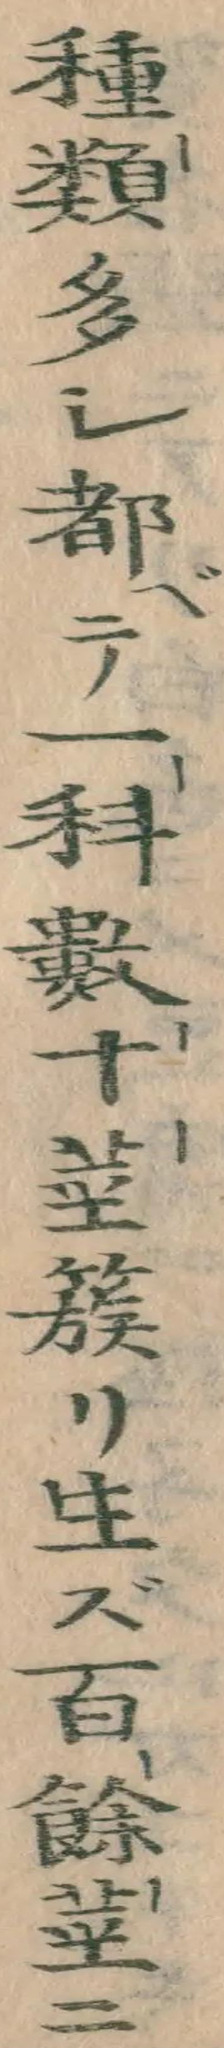種類多シ都ベテ一科数十茎簇リ生ズ百餘茎ニ
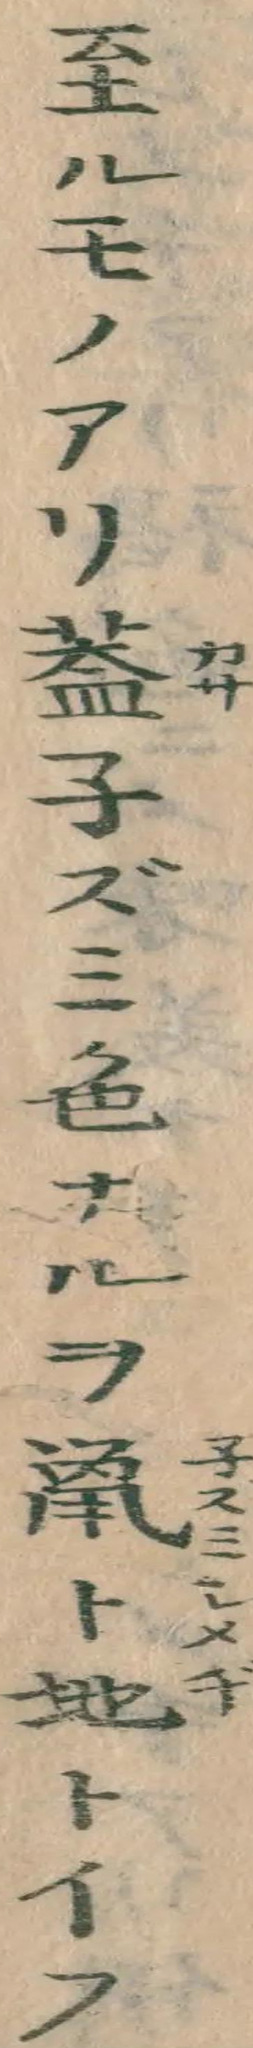至ルモノアリ葢ネズミ色ナルヲ鼠卜地トイフ
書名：怡顔斎菌品 2巻
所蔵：国立国会図書館 National Diet Library, JAPAN
